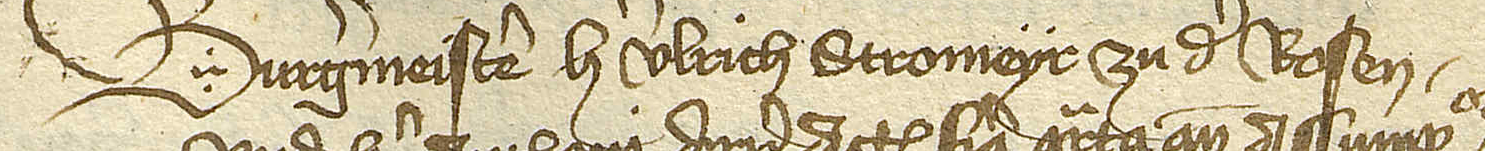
Burg*meiſte* h* vlrich Stromeyr cʒu d* Roſen /
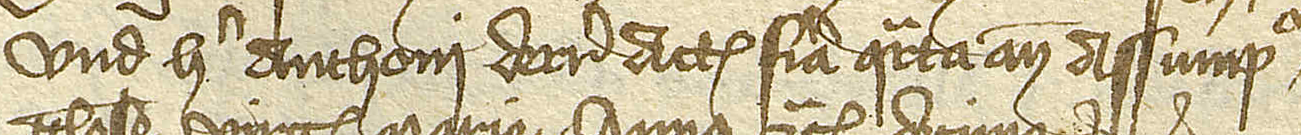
vnd h* Anthoni derr* Act* fia* qrta* an* Aſſump*
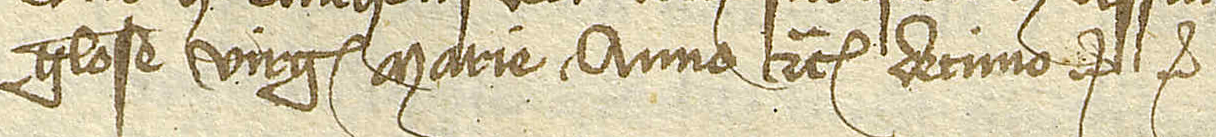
gloſe* virg* Marie / Anno ec* decimo § §
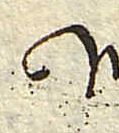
N
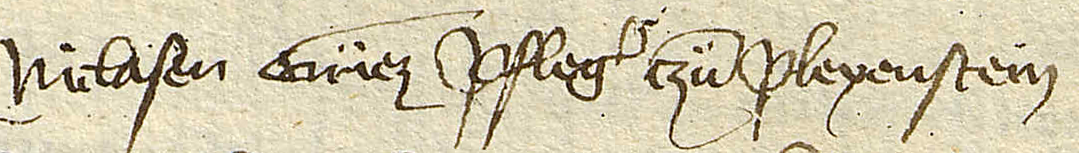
Niclaſen Grieʒ Pfleg* cʒü Pleyenſtein
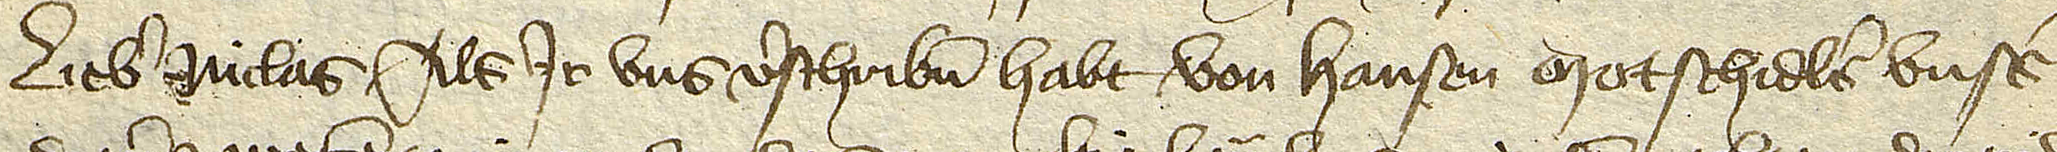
Lieb* Niclas / Als Ir vns v*ſchribn* habt / von hanſen Motſchidls* vnſs*
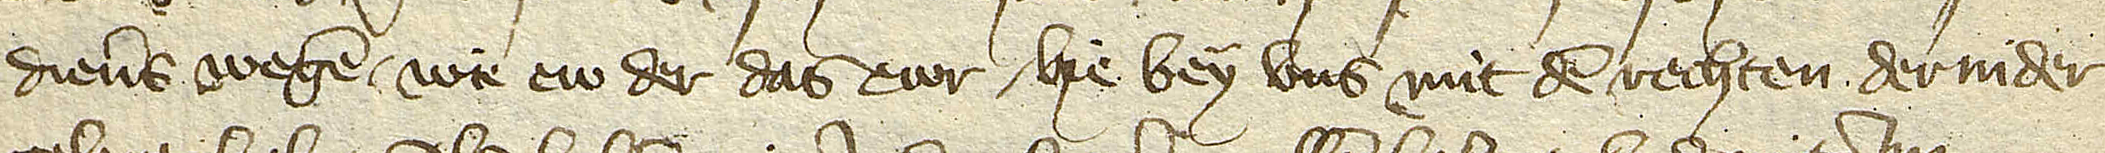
dien*s wege* / wie ew der das ewr / hie bey vns mit d* rechten dernider
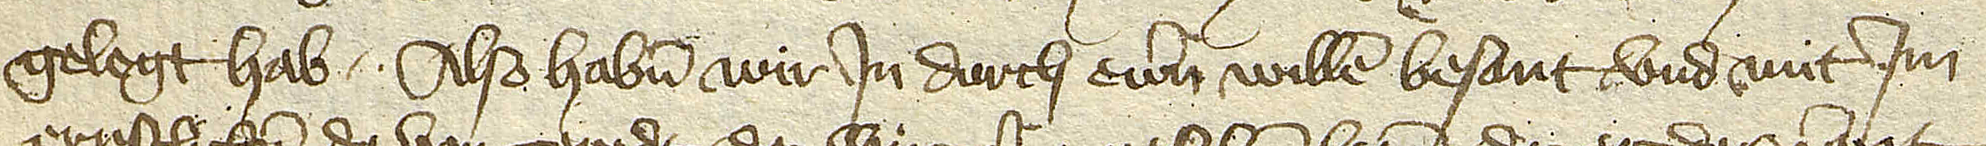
gelegt hab / . Alſo habn* wir In durch ew*n wille* beſant / vnd mit Im
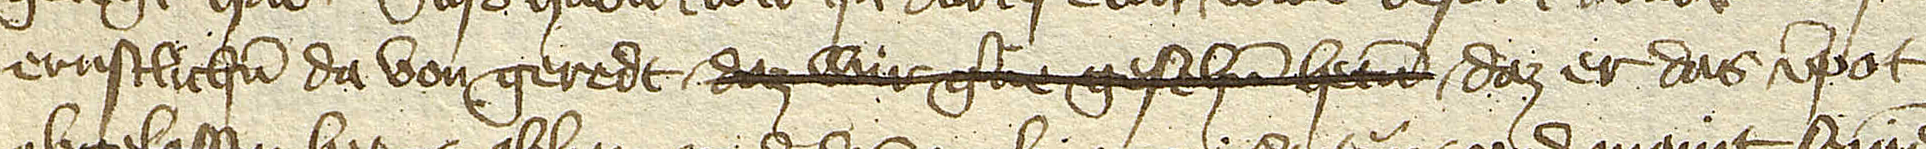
ernſtlichn* da von geredt / daʒ wir g*ne geſehn* hetn* / daʒ er das v*pot
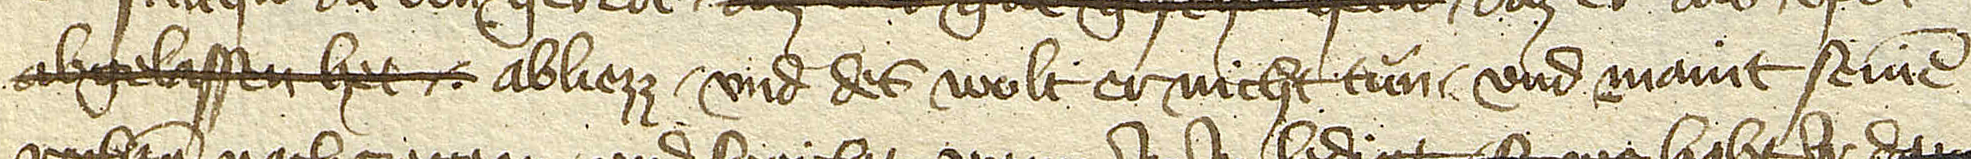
abgelaſſen het / . ablieʒʒ / vnd des wolt er nicht tün / vnd maint ſeine*
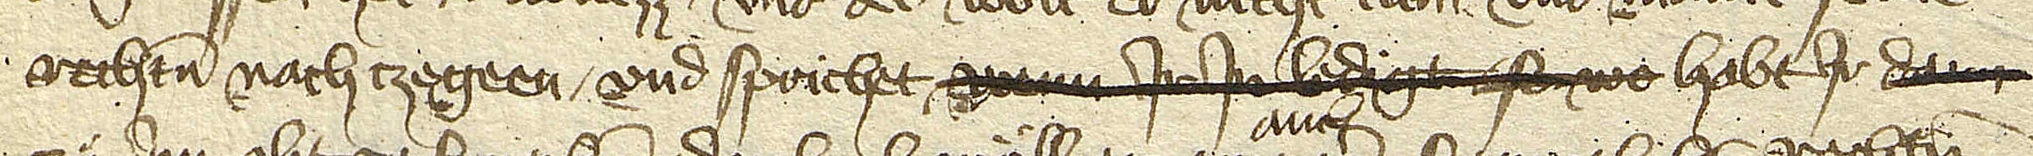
rechtn* nach cʒegeen / vnd ſprichet / wann Ir In ledigt / ſo wo habt Ir dann
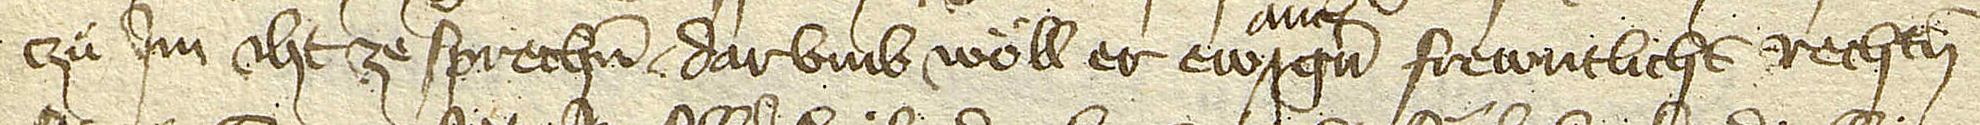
cʒü Im iht cʒu ſprechn* / darvmb wöll er ew gn* frewntlichs rechtn*
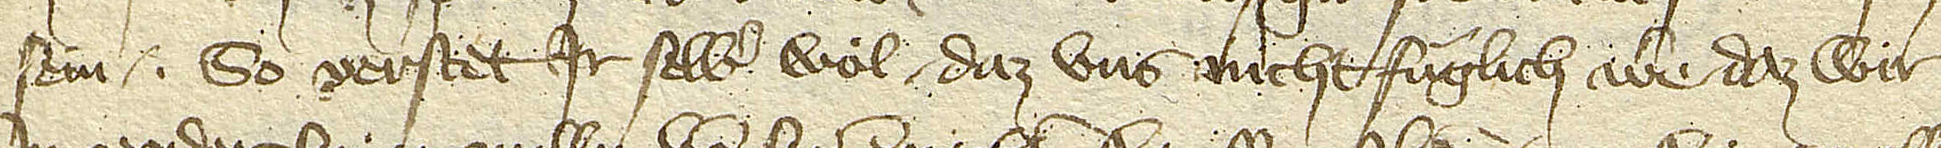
ſein / . So verſtet Ir ſelb* wol / daʒ vns nicht füglich w*e / daʒ wir
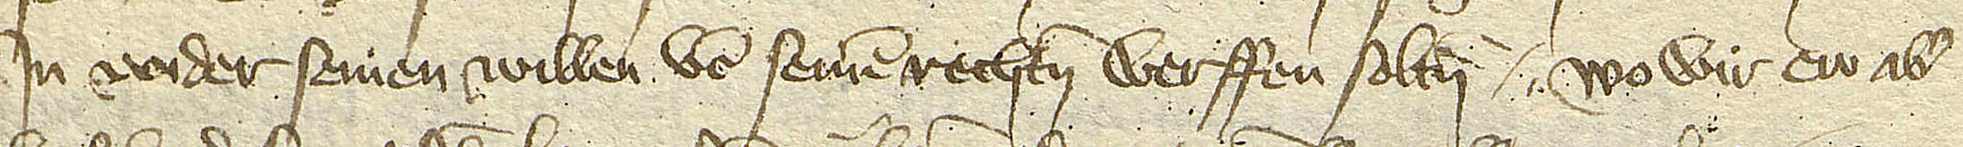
In wider ſeinen willen vo* ſeine* rechtn* werffen ſoltn* / wo wir ew ab*
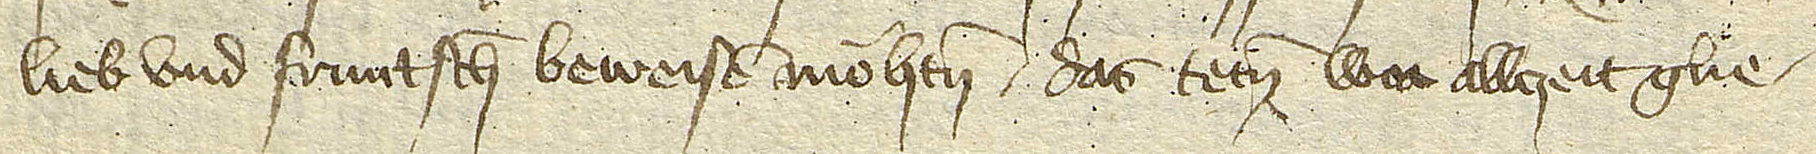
lieb vnd fruntſch* beweiſe* möhtn* / das tetn* wir allcʒeit g*ne /
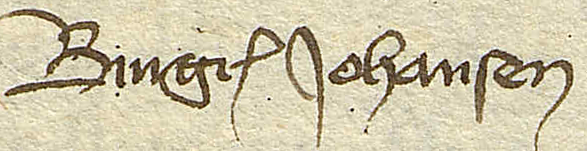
Burgr* Iohanſen
